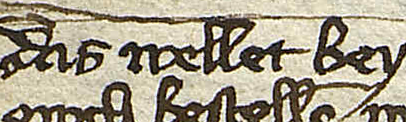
das wellet bey
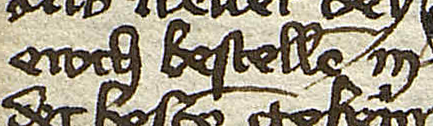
ewch beſtelle* in
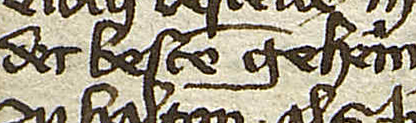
der beſte* geheim
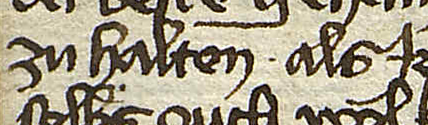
ʒu halten . als Ir
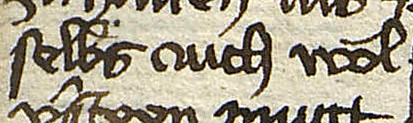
ſelbs auch wol*
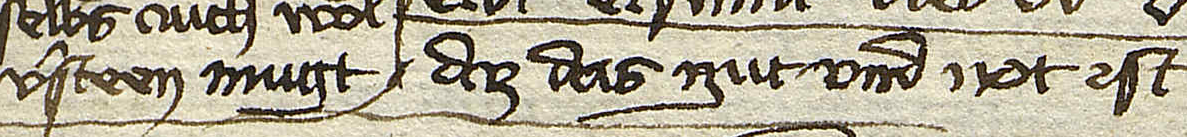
v*ſteen mugt / daʒ das gut vnd not iſt
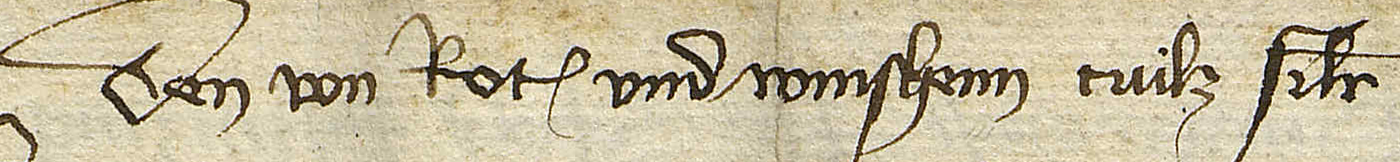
Den von Rot* vnd winſheim cuil* ſilr*
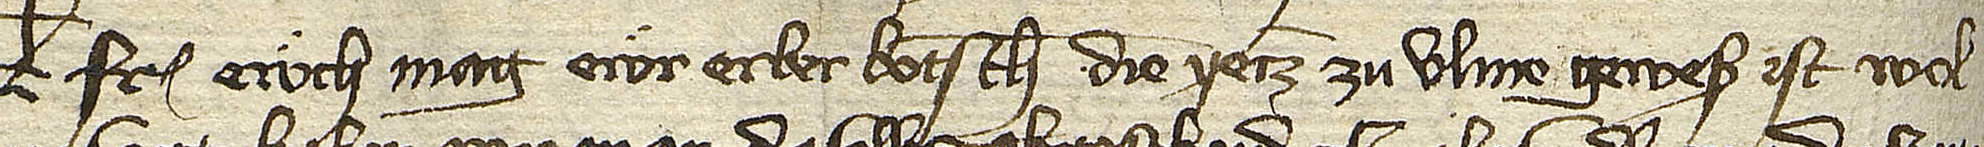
L* fr* eẅch mag eẅr erber* botſch* die yecʒ* ʒu Vlme geweſ* iſt wol
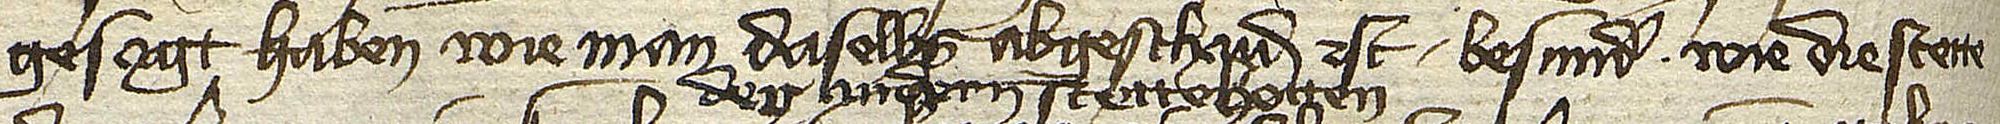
geſagt haben wie man daſelbs abgeſchaid* iſt / beſund* . wie die ſtette
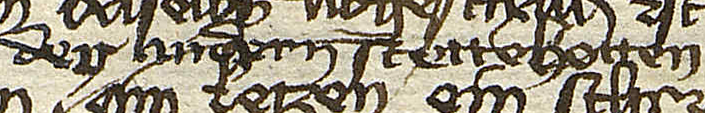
der andern ſtettebotten
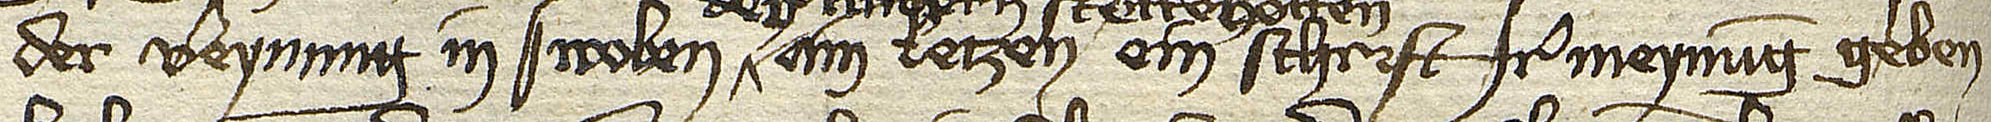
der v*eynung in ſwoben am lecʒen ein ſchrift Ir* meynu*g geben
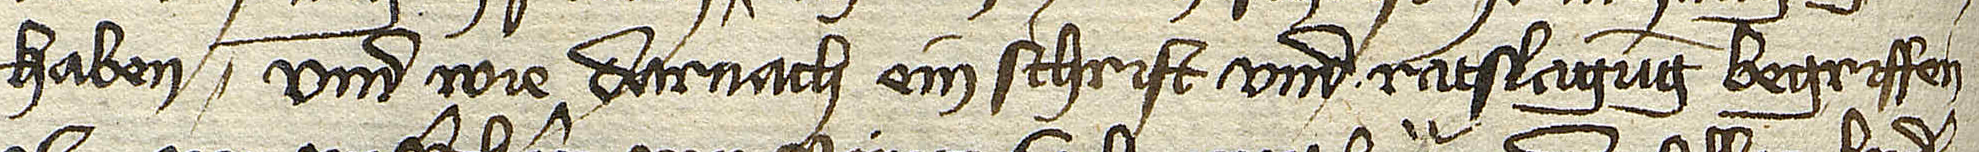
haben / vnd wie Darnach ein ſchrift vnd . ratſlagu*g begriffen
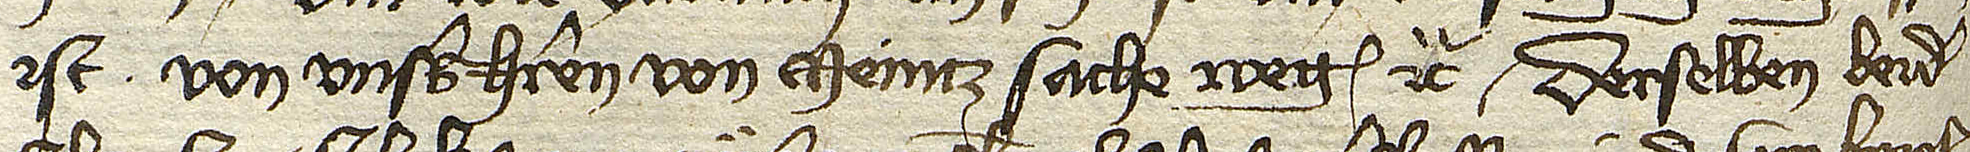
iſt . von vnſ*s h*ren von Meincʒ ſache weg* ec* / Derſelben beid*
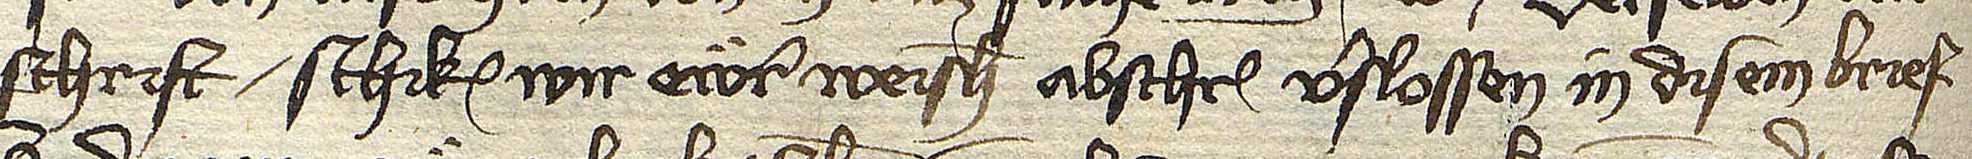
ſchrift / ſchik* wir eẅr* weiſh* abſchr* v*ſloſſen in diſem brief
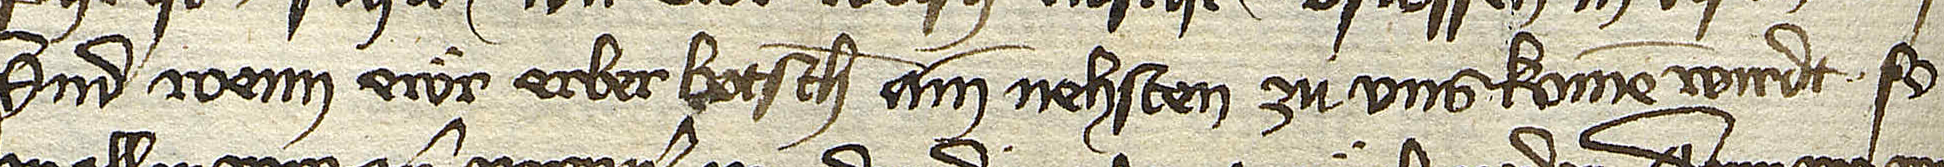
Vnd wenn eẅr erber botſch* a*m nehſten ʒu vns kome* wirdt . ſo
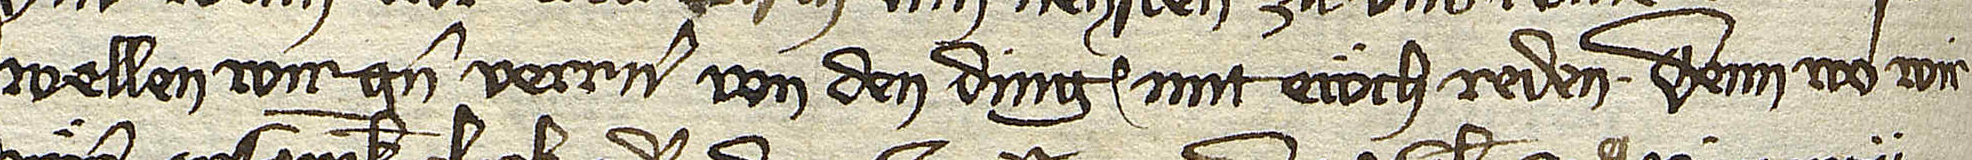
wellen wir g*n verr*n von den ding* mit eẅch reden . Denn wo wir
